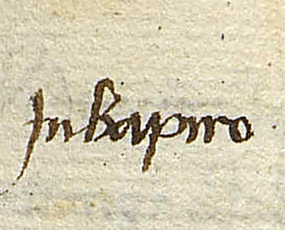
In bapiro
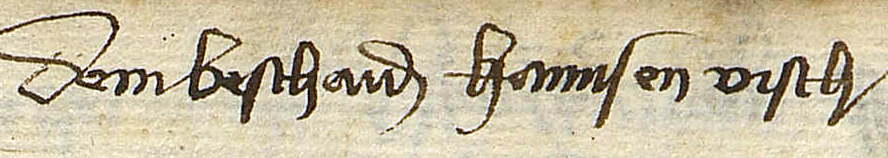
Dem beſchaid* hannſen viſch*
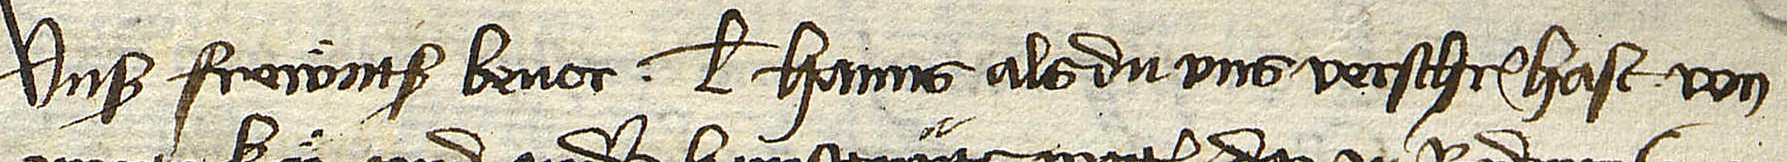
Vnſ* frewntſ* beuor . L* hanns als du vns verſchr* haſt von
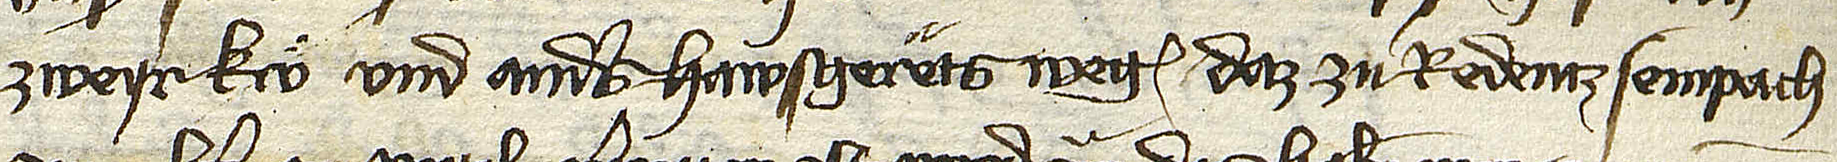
ʒweyr kw vnd and*s hawſgerëts weg* / daʒ ʒu Redencʒ ſempach
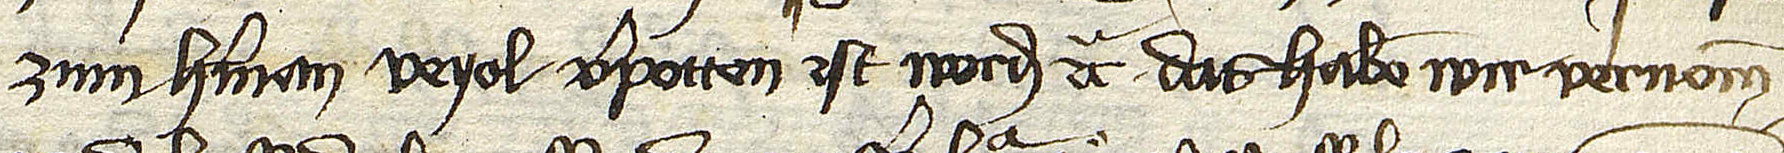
ʒum h*man veyol v*potten iſt word* ec* / das habe* wir vernom*
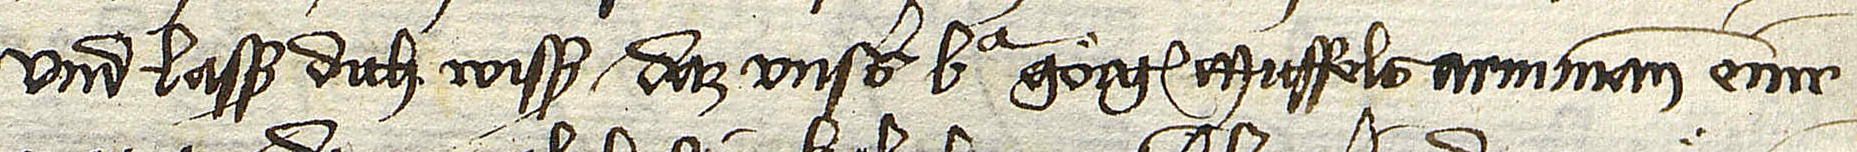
vnd laſſ* dich wiſſ* / daʒ vnſ*s b* görg* Muffels armman* einr
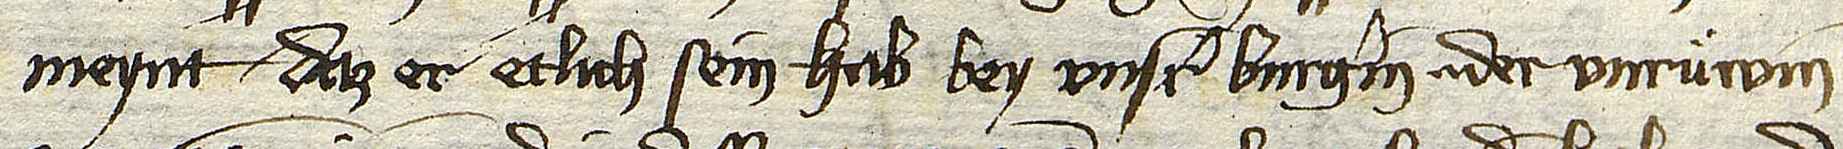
meynt / daʒ er etlich ſein hab bey vnſ*r burg*in ~ der vnrüwin
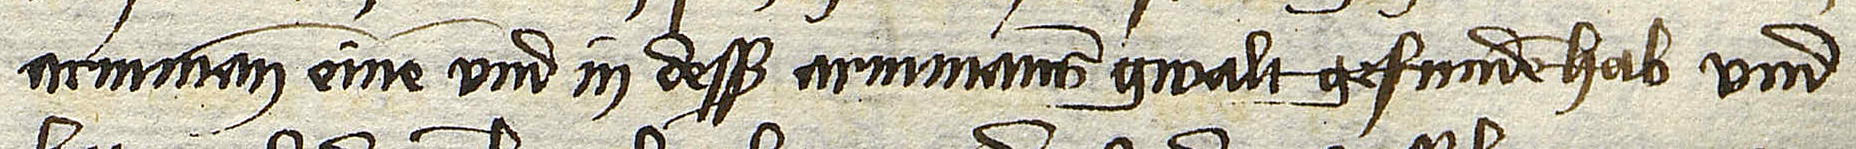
armman* eine* vnd in deſſ* armmans* gwalt gefunde* hab vnd
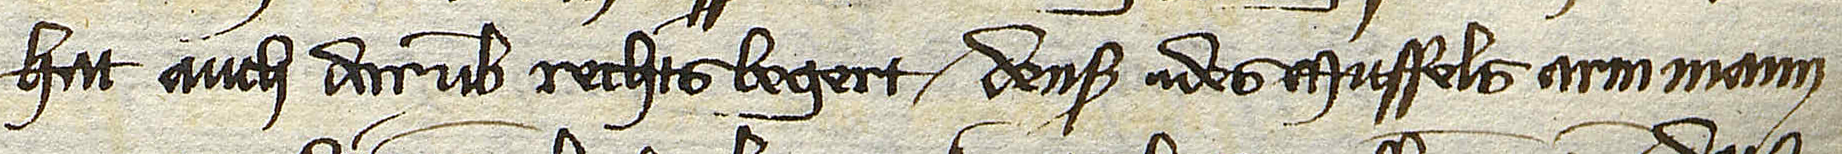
hat auch daru*b rechts begert / denſ* ~ des Muffels arm mann
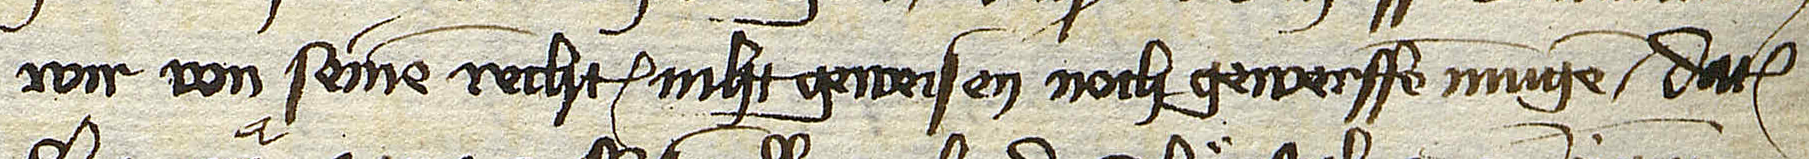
wir von ſeine* recht* niht geweiſen noch gewerffe* muge* / dat*
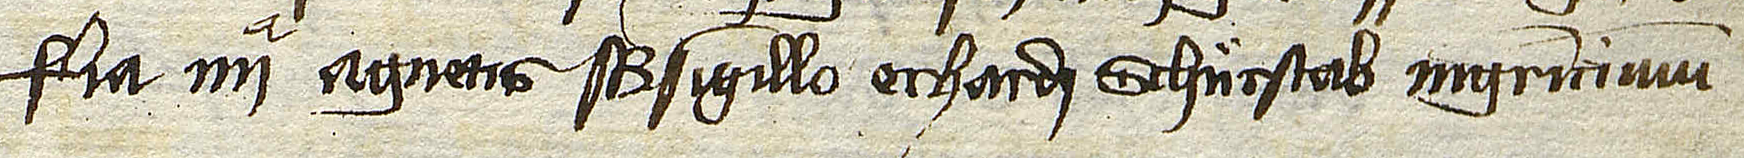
fia* iiii* agnetis ſ*B ſigillo erhardi Schürſtab m*g*riciuiu*
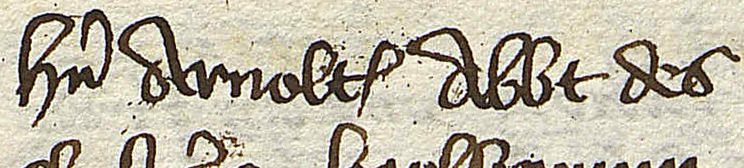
H*n Arnolt* Abbt des
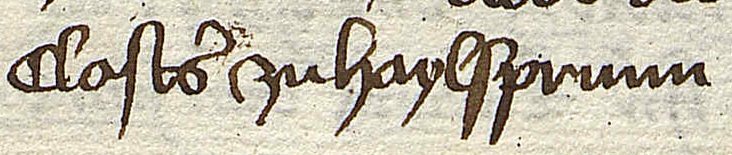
Cloſt*s cʒu haylſprunn
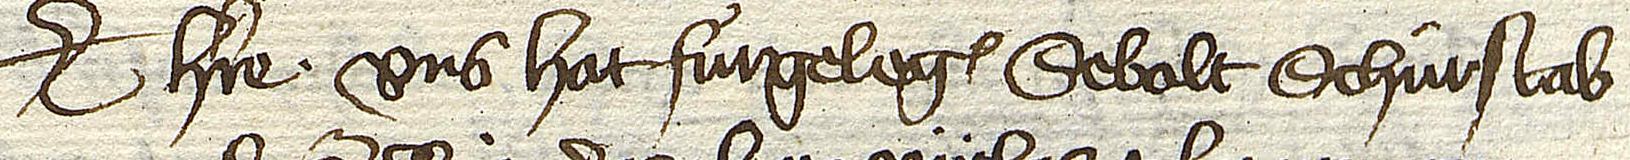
L* h*re . vns hat fürgeleg* Sebalt Schürſtab
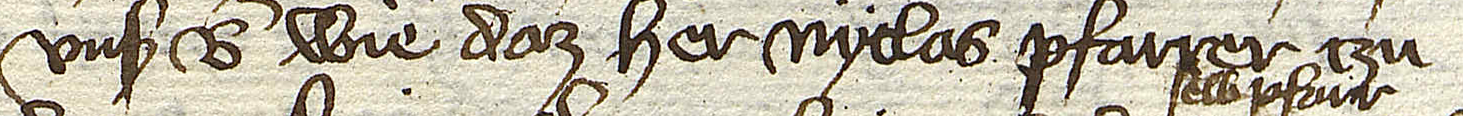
vnſ* B* wie daʒ her Nyclas pfarrer cʒu
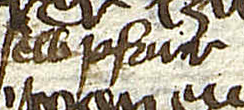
ſelb pfarr
